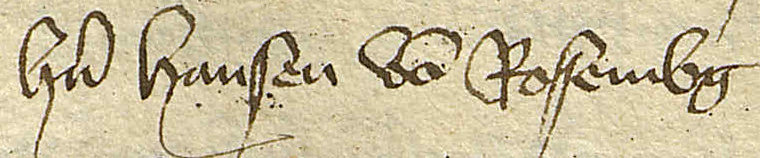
hn* hanſen vo* Roſembg*
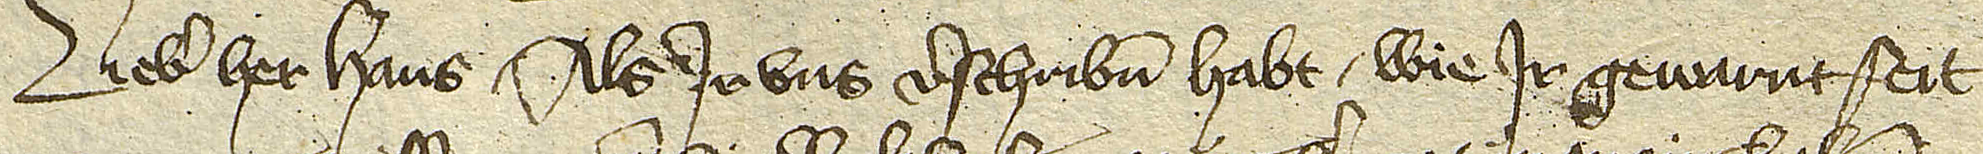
Lieb* her hans / Als Ir vns v*ſchribn* habt / wie Ir gewarnt ſeit
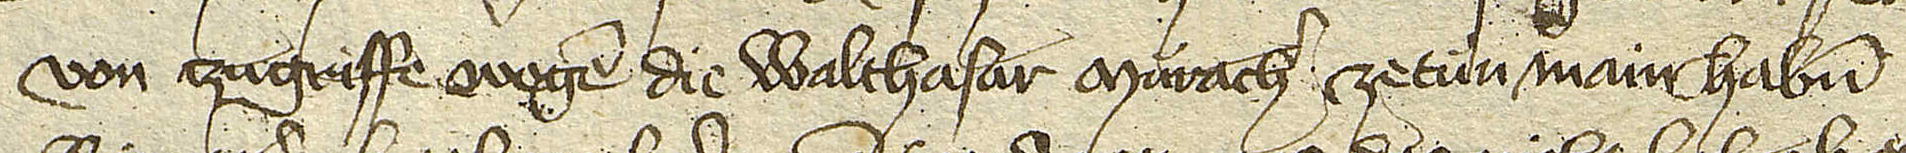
von cʒugriffe wege* die Walthaſar Mürach* cʒetün main / habn*
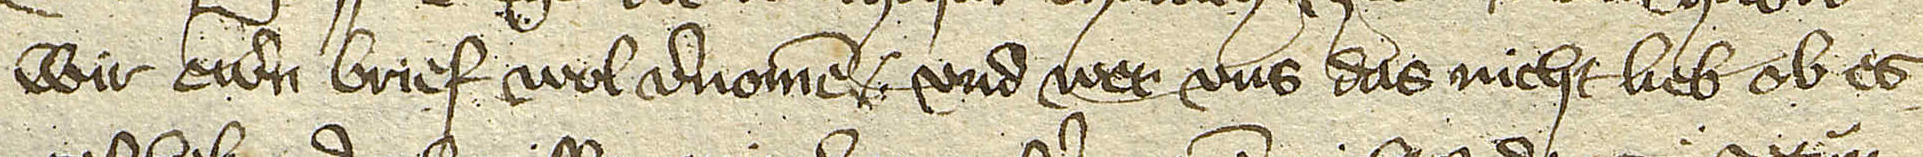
wir ewn* brief wol v*nome* / . vnd wer vns das nicht lieb ob es
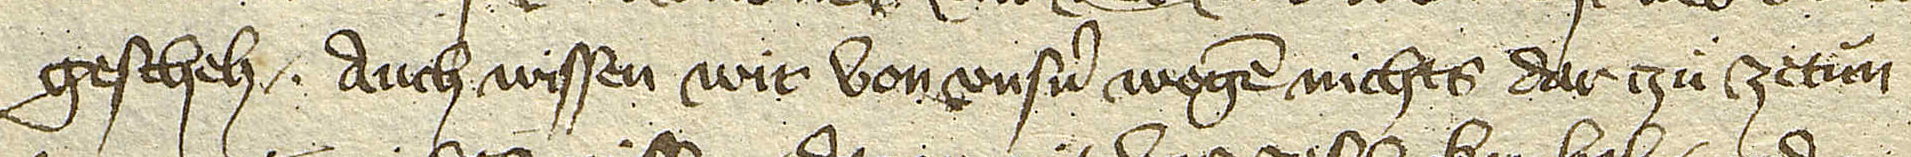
geſcheh / . Auch wiſſen wir von vnſn* wege* nichts dar cʒü cʒetün
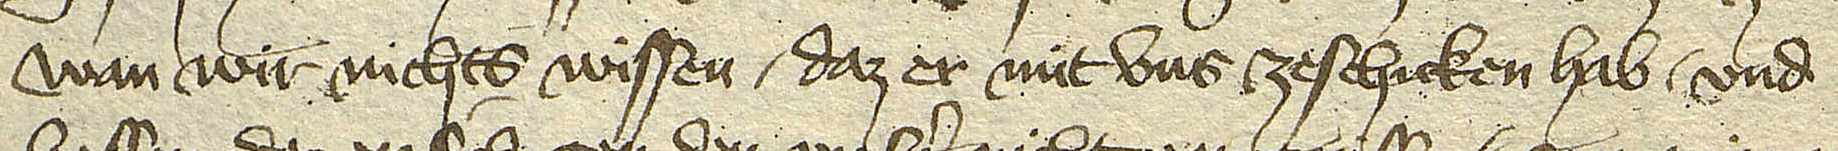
wan wir nichts wiſſen / daʒ er mit vns cʒeſchicken hab / vnd
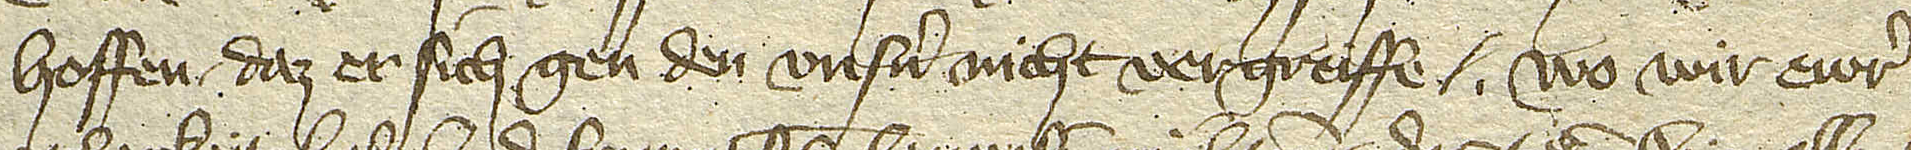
hoffen / daʒ er ſich gen den vnſn* nicht vergreiffe / . wo wir ewr*
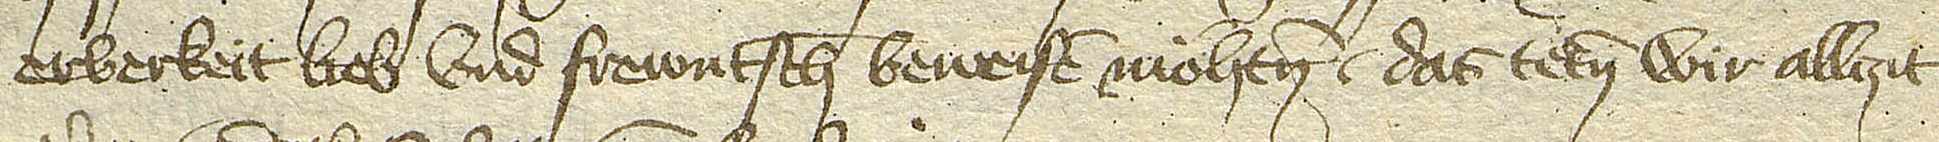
erberkeit lieb vnd frewntſch* beweiſe* möhtn* / das tetn* wir allcʒit
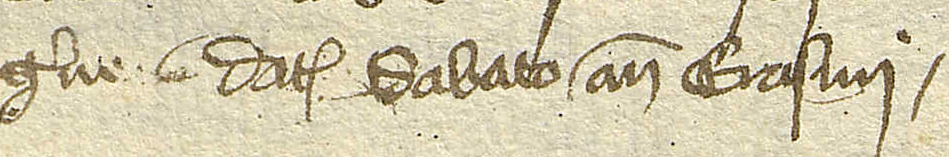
g*ne / dat* Sabato an* Eraſmi /
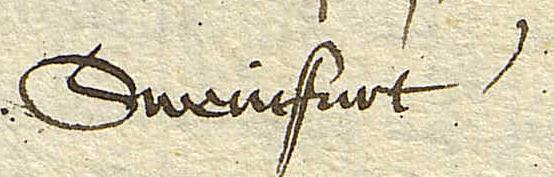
Sweinfurt /
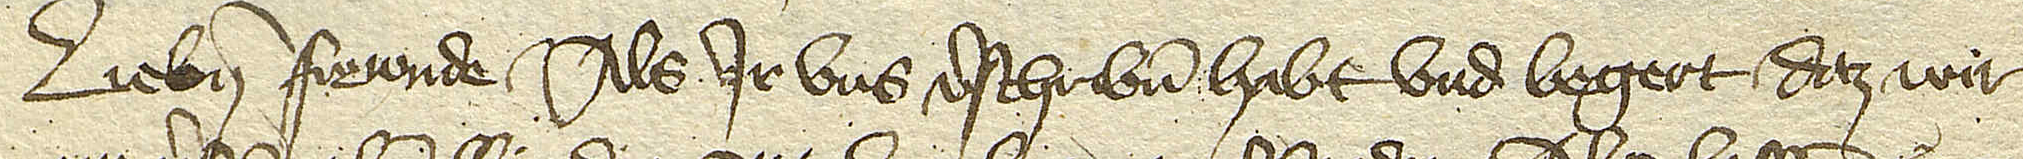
Liebn* frewnde / Als Ir vns v*ſchribn* habt vnd begert / daʒ wir
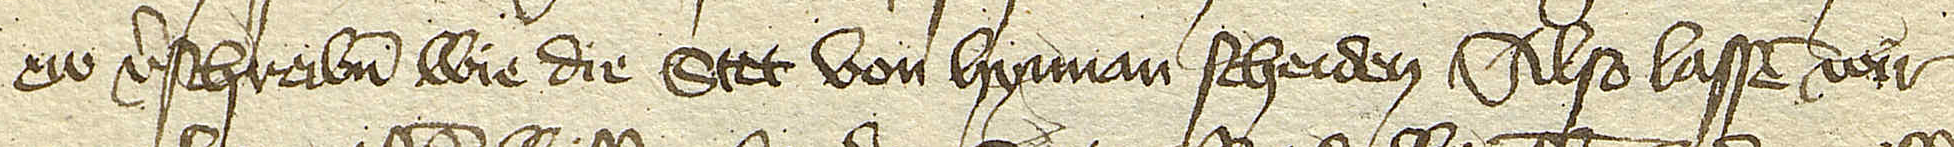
ew v*ſchreibn* wie die Stet von hynnan ſcheiden / Alſo laſſe* wir
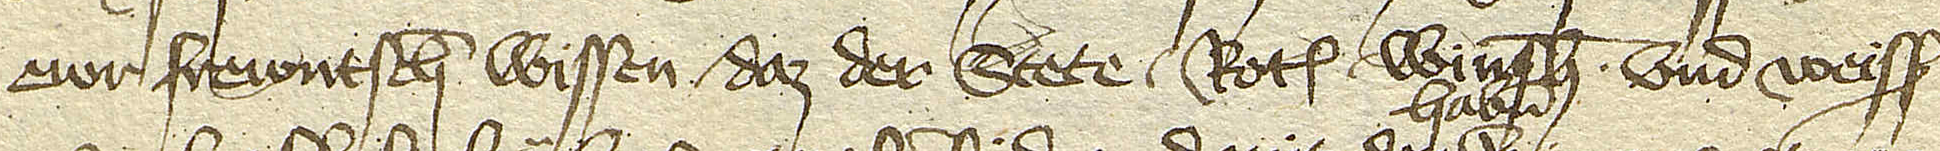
ewr frewntſch* wiſſen / daʒ der Stete / Rot* / winſh* . vnd weiſſ*
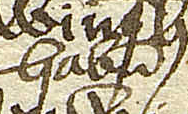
habn*
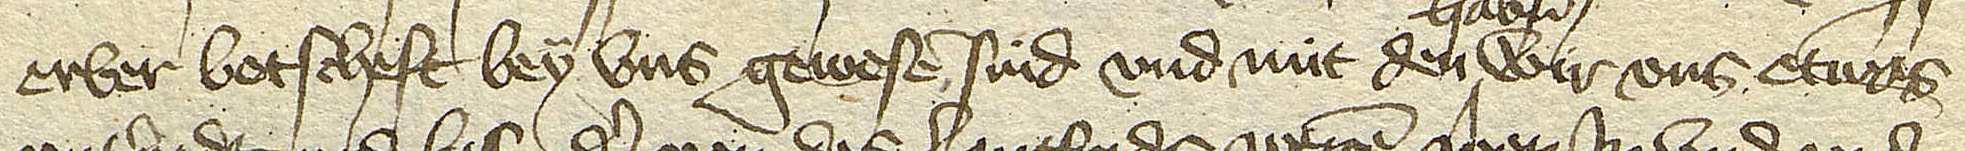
erber botſcheft bey vns geweſe* ſind vnd mit den wir vns etwas
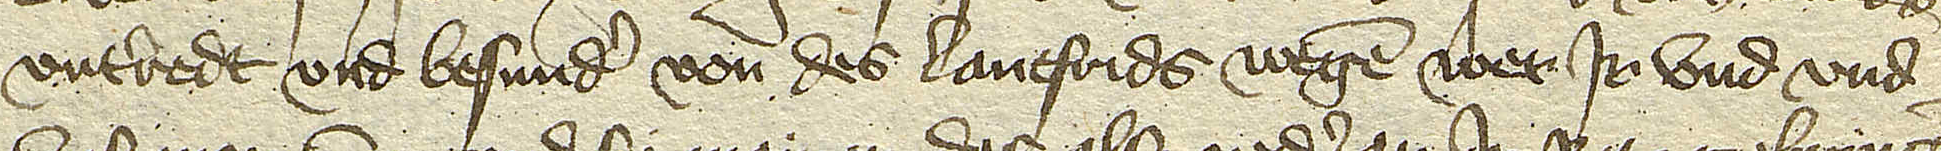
vnt*redt vnd beſund* von des lantfrids wege* wer Ir vnd vnd
